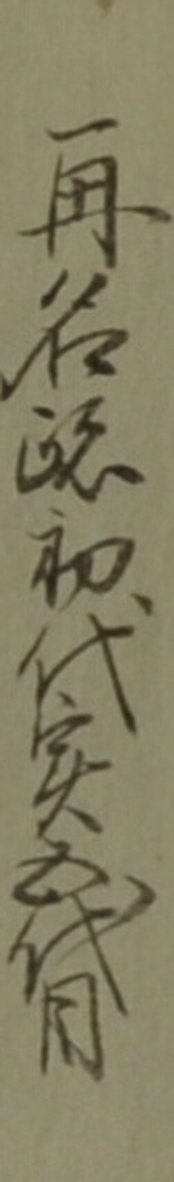再名跡初代実五代目
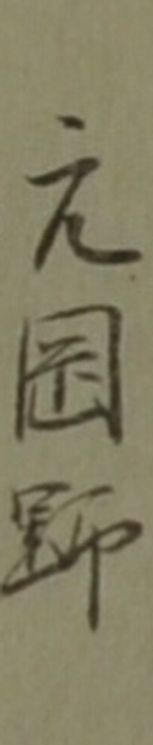元岡野
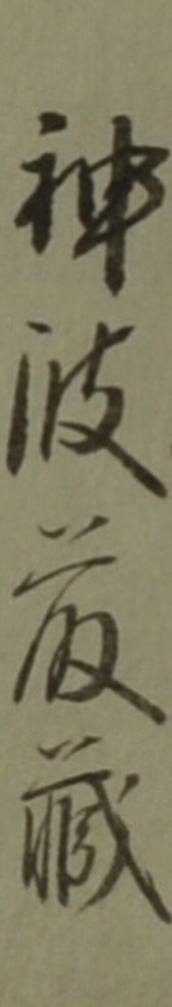神波藤蔵
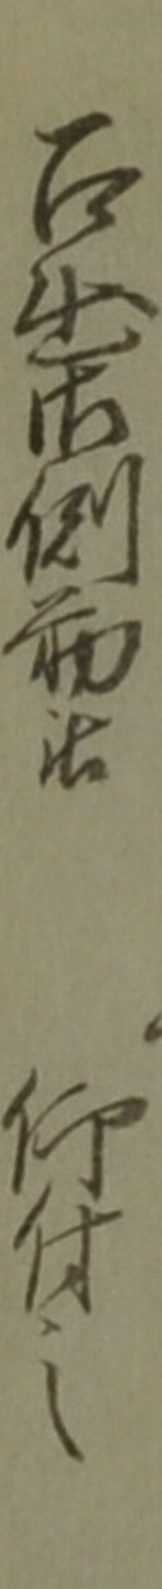召出御側勤被仰付之
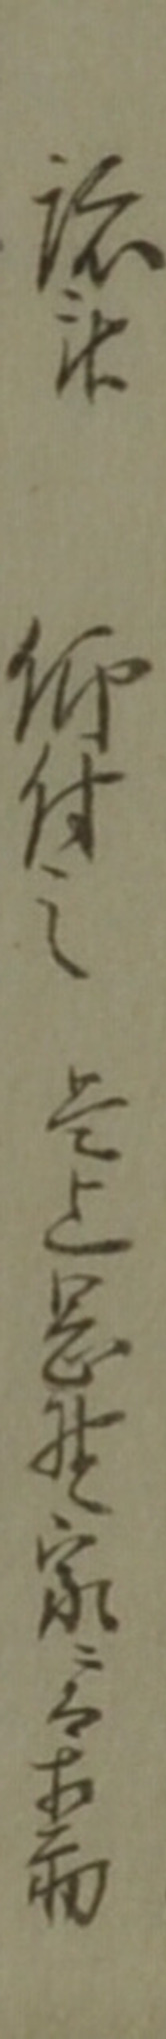跡被仰付之是迄岡野家ニ而相勤
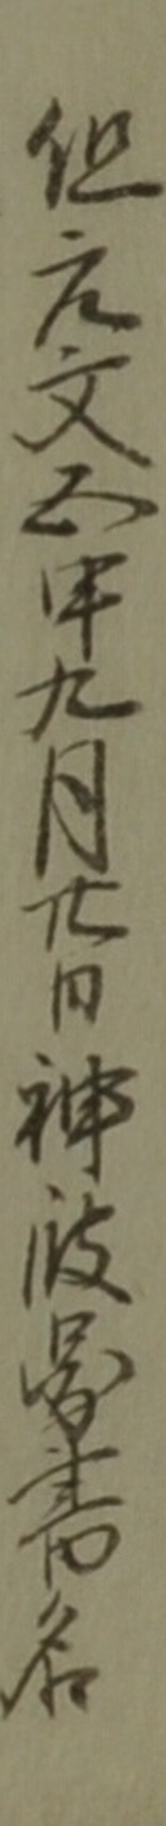但元文五申九月廿日神波図書名
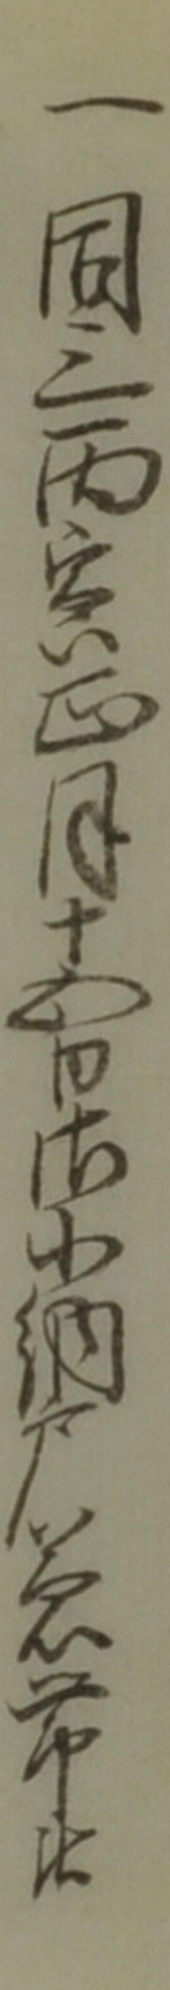一同三丙寅正月十五日御小納戸兼帯被
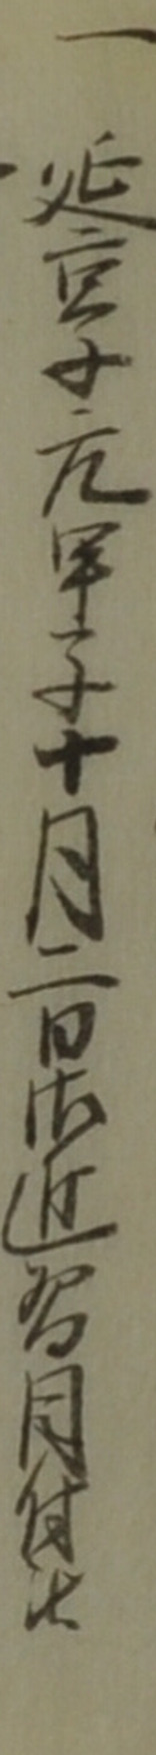一延享元甲子十月二日御近習目付被
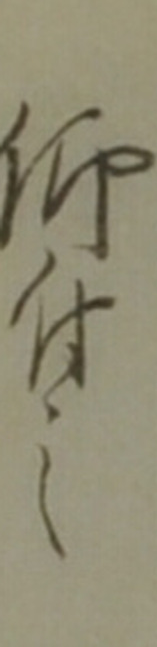仰付之
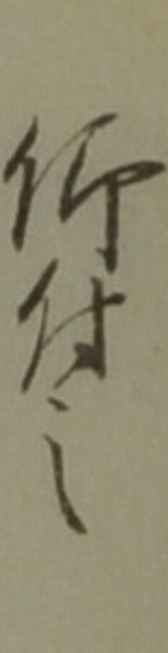仰付之
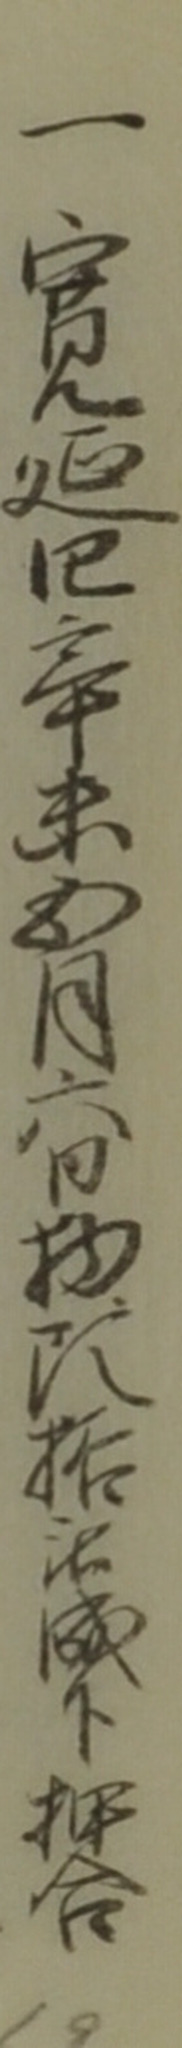一寛延四辛未五月六日物頭格被成下押合
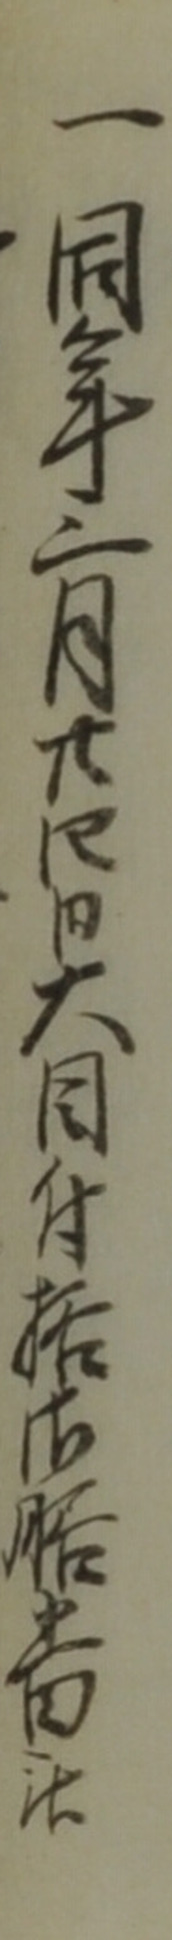一同年三月廿四日大目付格御膳番被
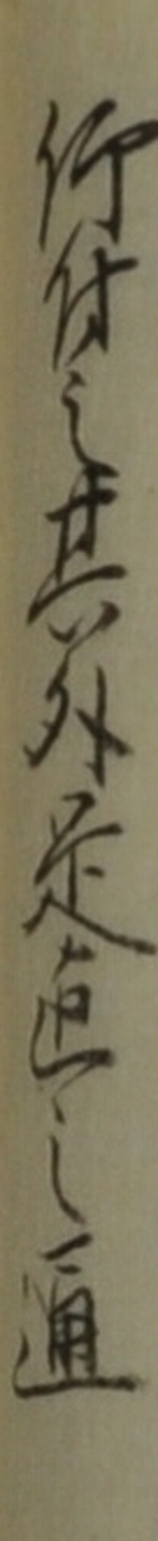仰付之其外是迄之通
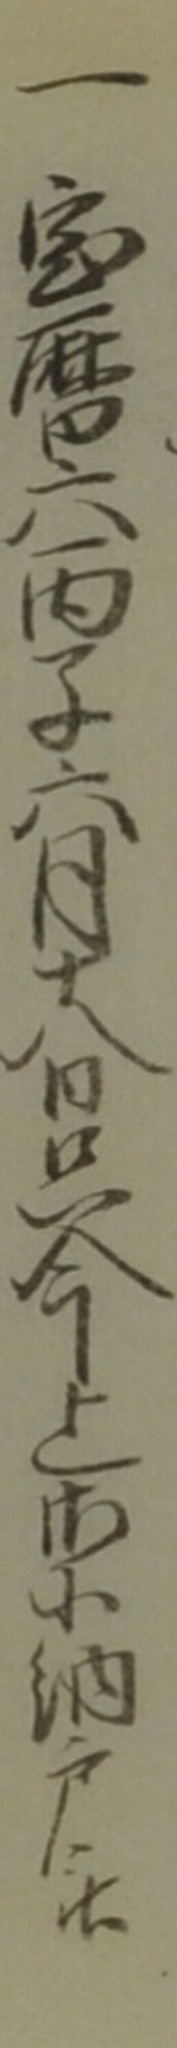一宝暦六丙子六月十八日只今迄御小納戸被
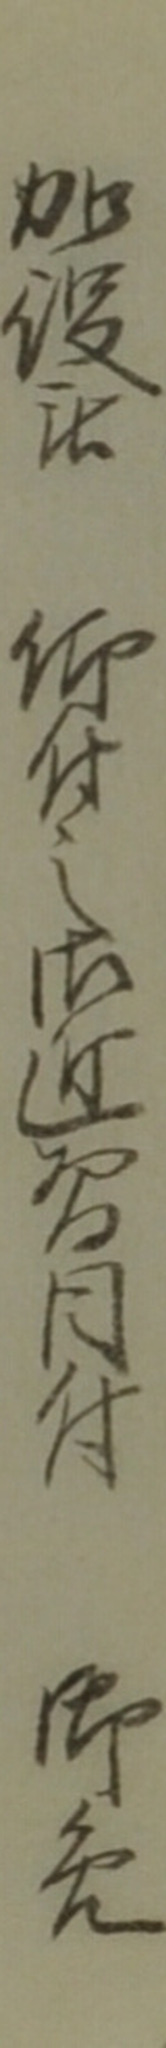加役被仰付之御近習目付御免
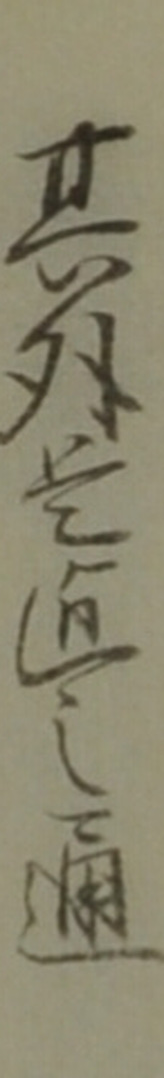其外是迄之通
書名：諸御役代々録（五）
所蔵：伊那市立高遠町図書館・合同会社AMANE
